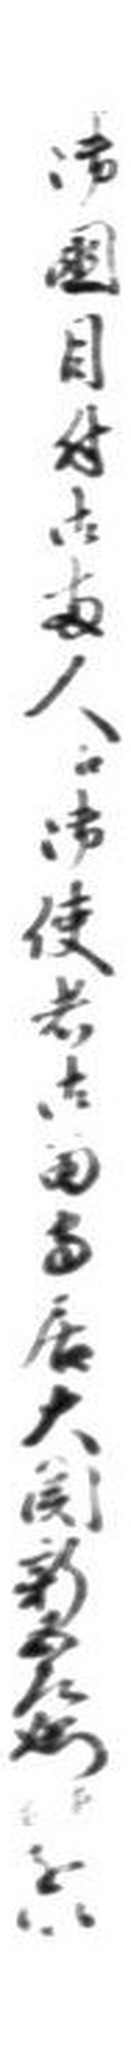御国目付御両人江御使者御留守居大関新五左衛門を以
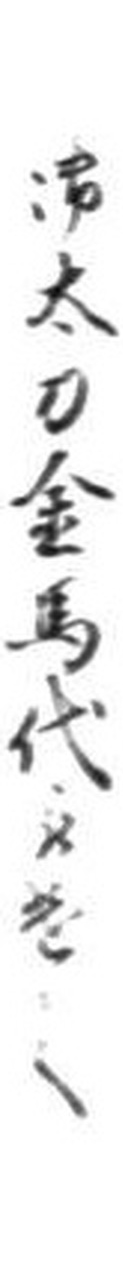御太刀金馬代被遣之
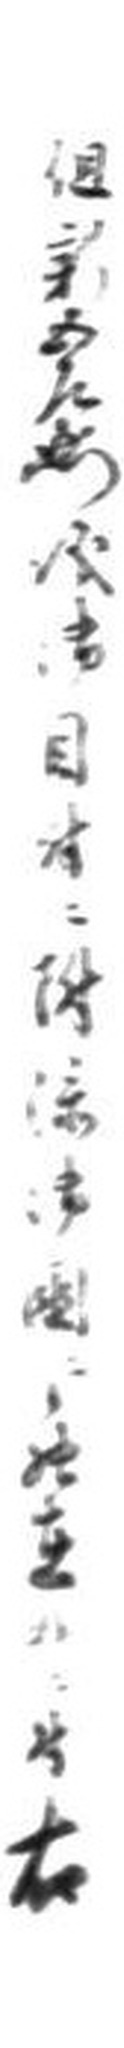但新五左衛門儀御目付ニ附添御国ニ罷在候ニ付右
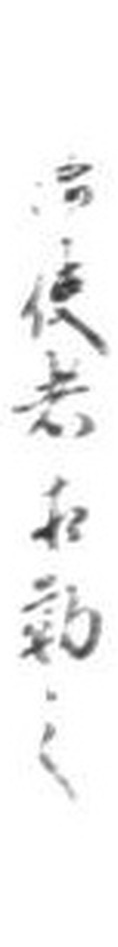御使者相勤之
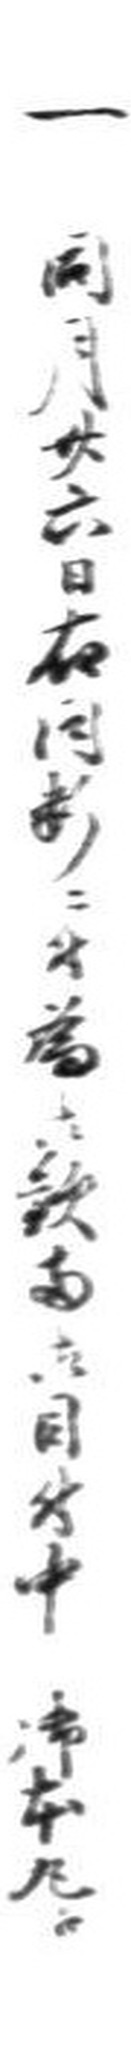一同月廿六日右同断ニ付為御歓両御目付中御本丸江
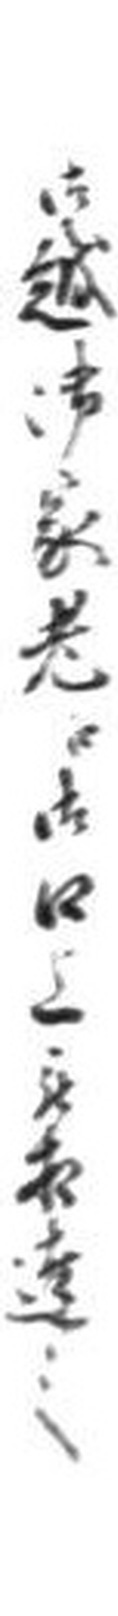御越御家老江御口上被相達之
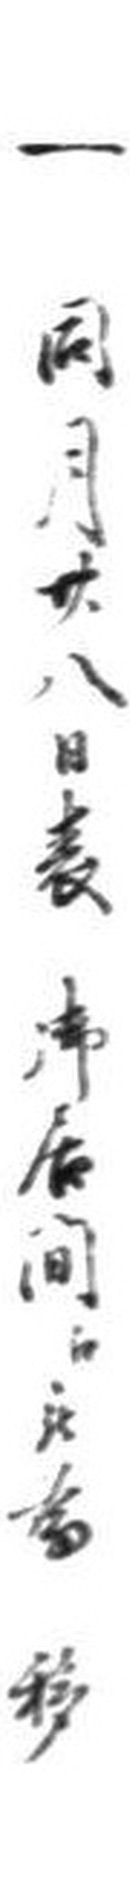一同月廿八日表御居間江被為移

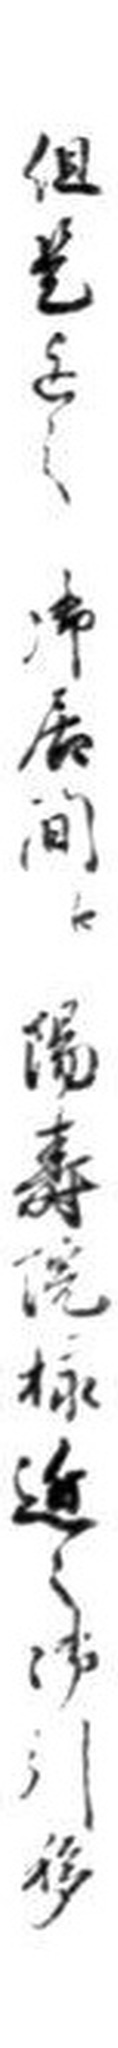但是を之御居間江陽寿院様近々御引移
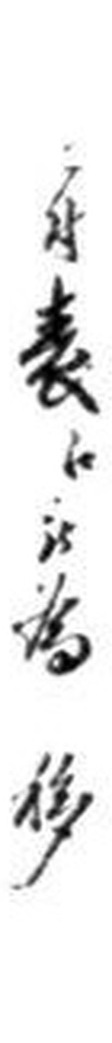ニ付表江被為移
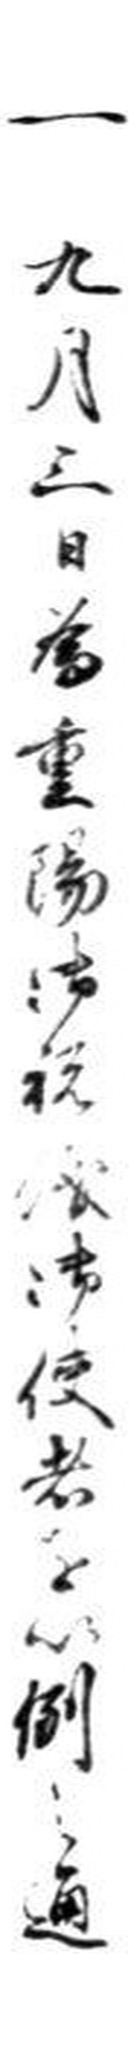一九月三日為重陽御祝儀御使者を以例之通
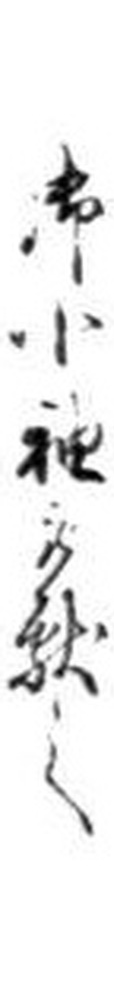御小袖被献之
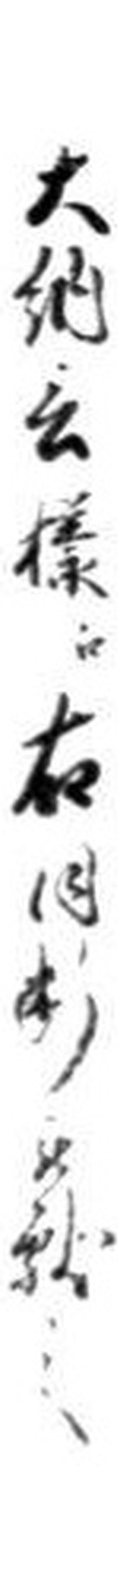大納言様江右同断被献之
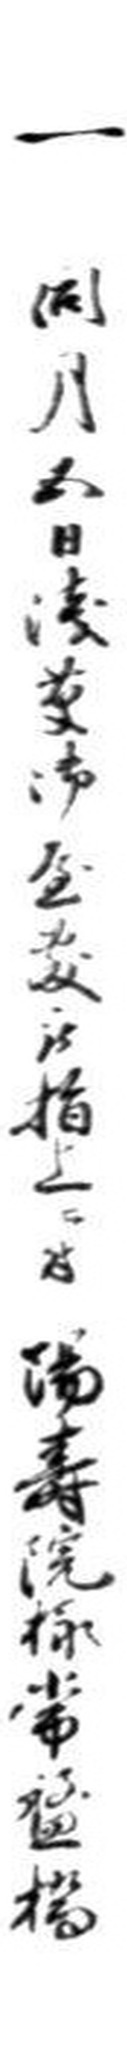一同月五日浅草御屋敷被指上ニ付陽寿院様常盤橋
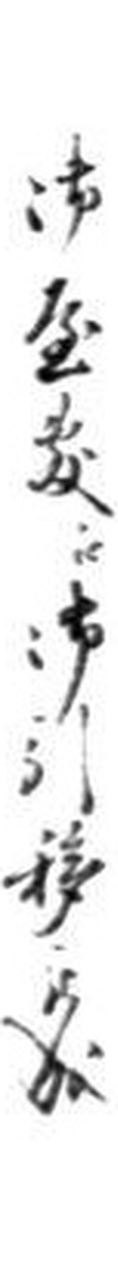御屋敷江御引移被成
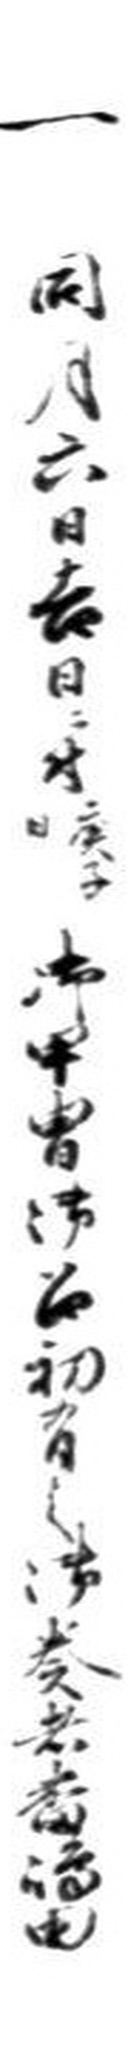一同月六日吉日ニ付庚子日御甲冑御召初有之御奏者番嶋田
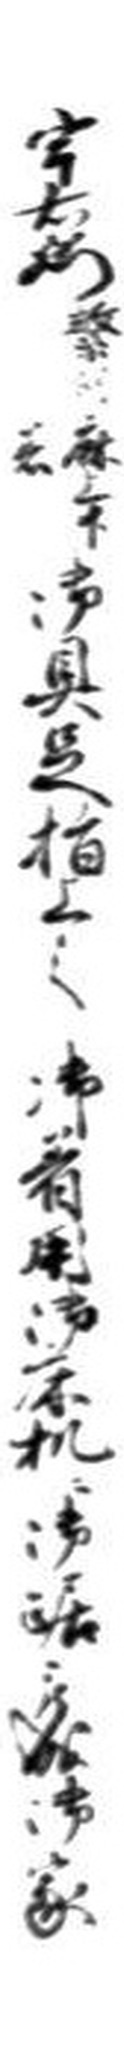宇右衛門繁麻上下着御具足指上之御着用御床机ニ御踞被成御家
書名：家譜 三十九 宗矩公 享保十年
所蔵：福井県文書館 Fukui Prefectural Archives
